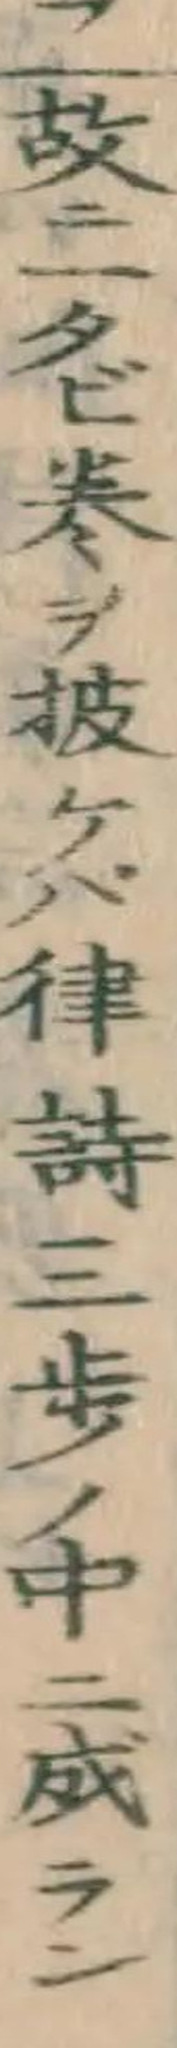故ニ一タビ巻ヲ披ケバ律詩三歩ノ中ニ成ラン
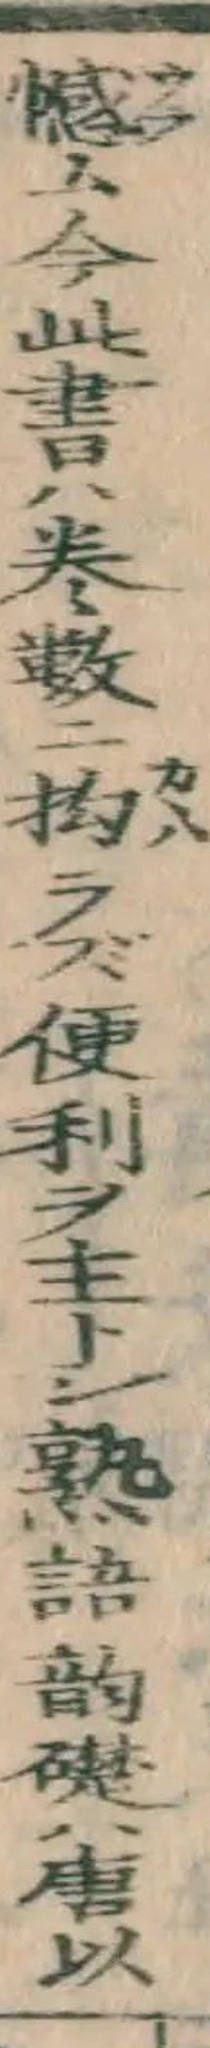憾ム今此書ハ巻数ニ拘ラズ便利ヲ主トシ熟語韵礎ハ唐以
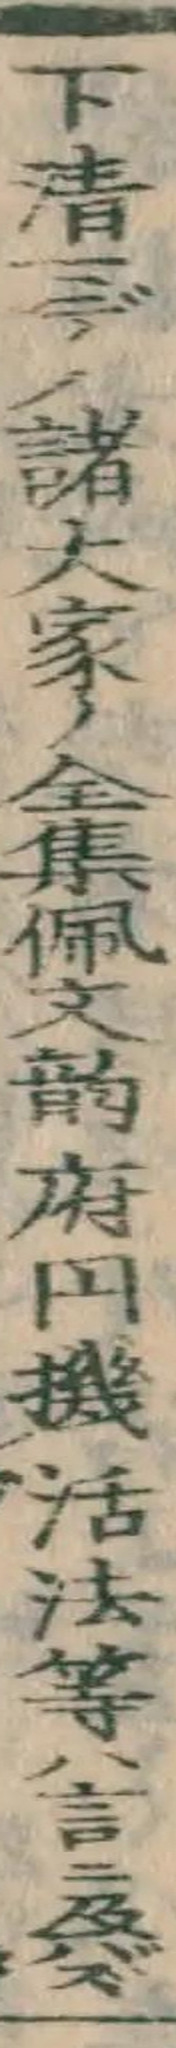下清マデノ諸大家ノ全集佩文韵府円機活法等ハ言ニ及バズ
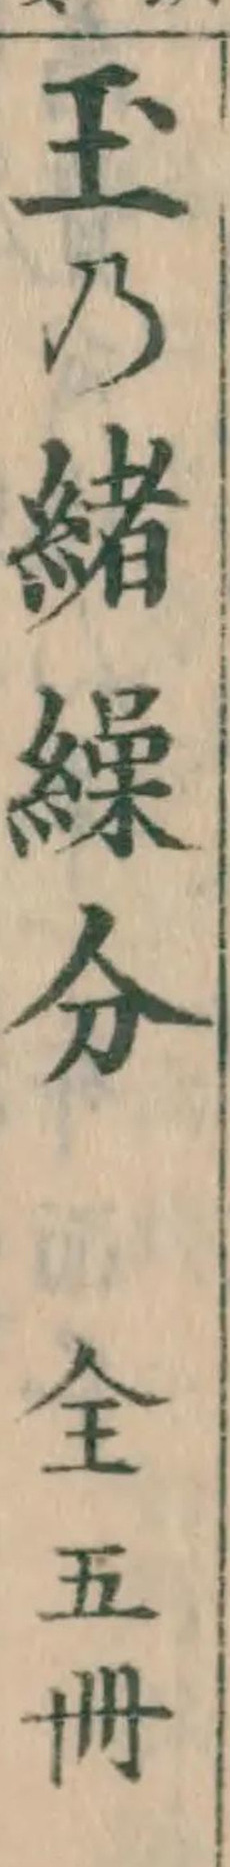玊の緒繰分全五冊
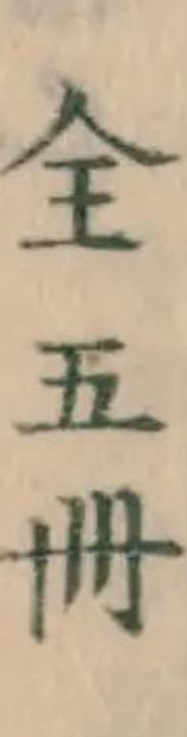全二冊
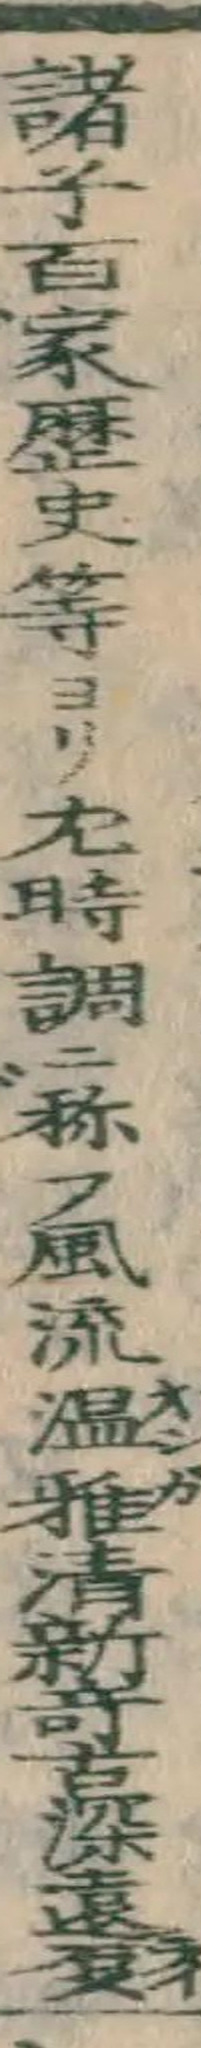諸子百家歴史等ヨリ尤時調ニ称フ風流温雅清新奇古深遠磊
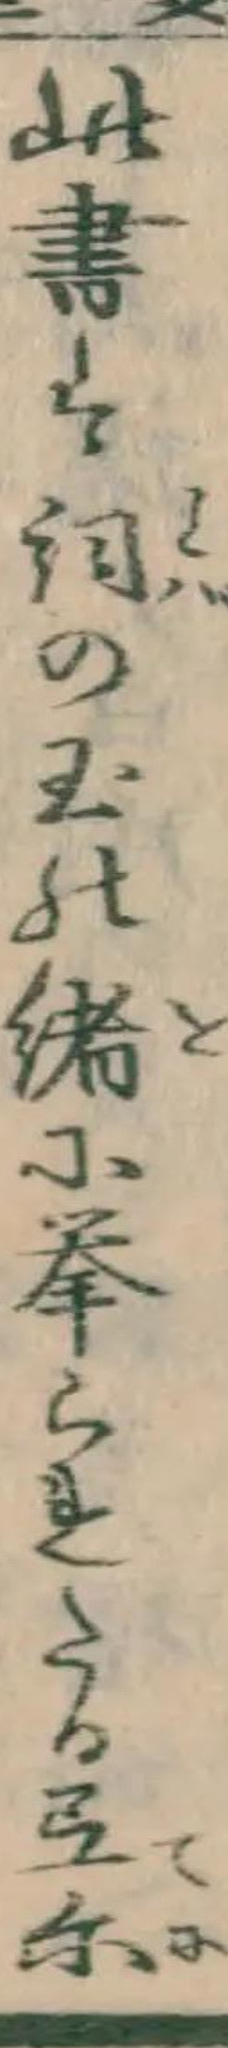此書は詞の玉の緒に挙られたる弖尓
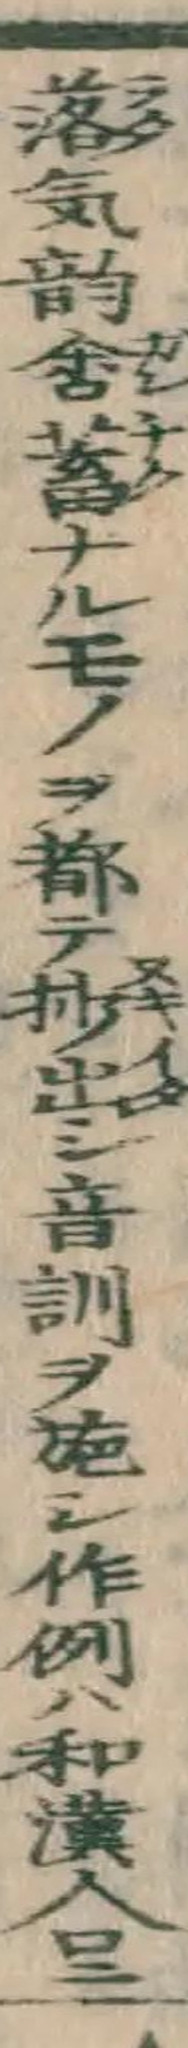落気韵含蓄ナルモノヲ都テ抄出シ音訓ヲ施シ作例ハ和漢人口ニ
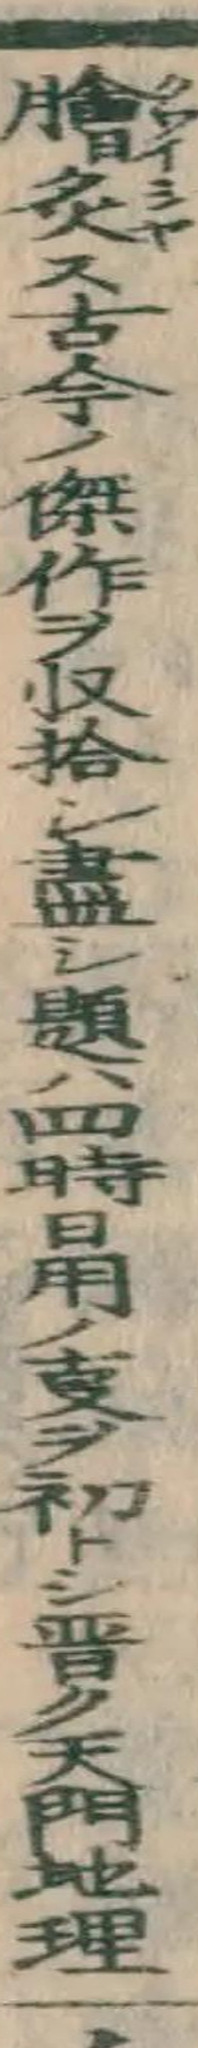膾炙ス古今ノ傑作ヲ収拾シ尽シ題ハ四時日用ノ事ヲ初トシ晋ク天門地理
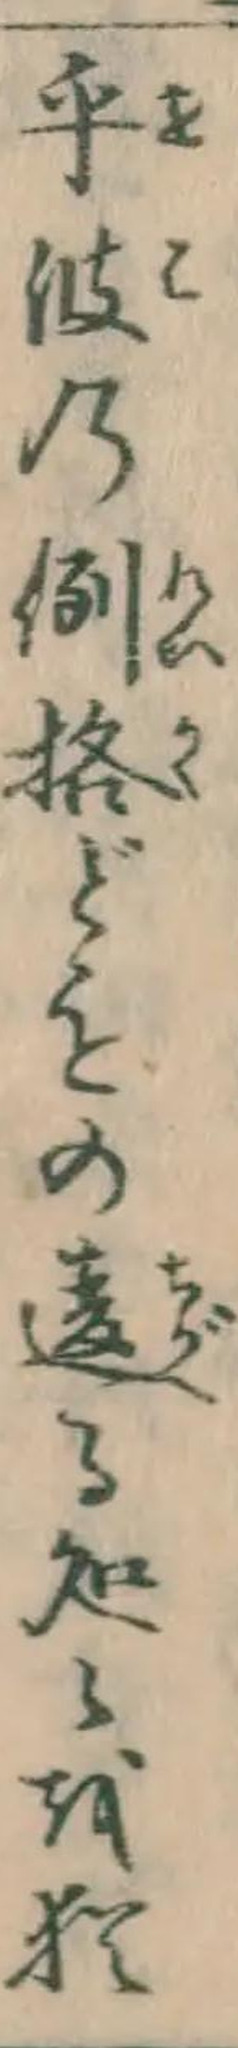乎波の例格どもの違る処々を猶
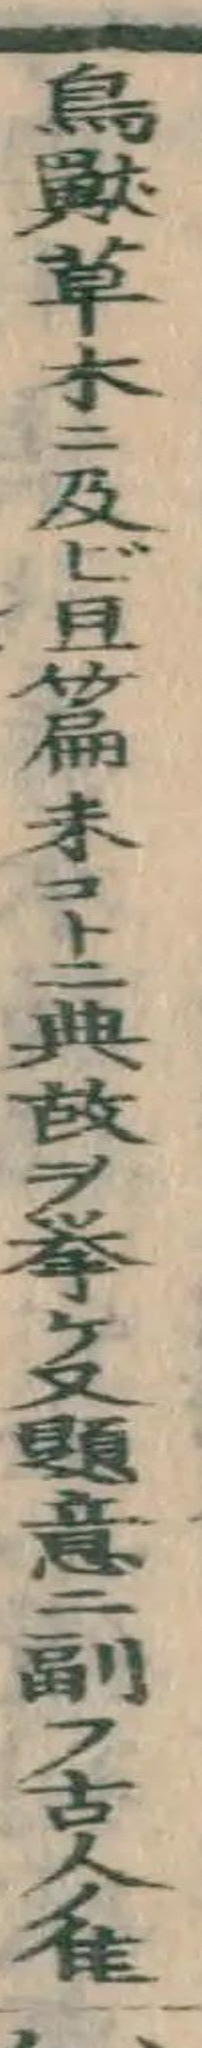鳥獣草木ニ及ビ且篇未コトニ典故ヲ挙ケ又題意ニ副フ古人ノ隹
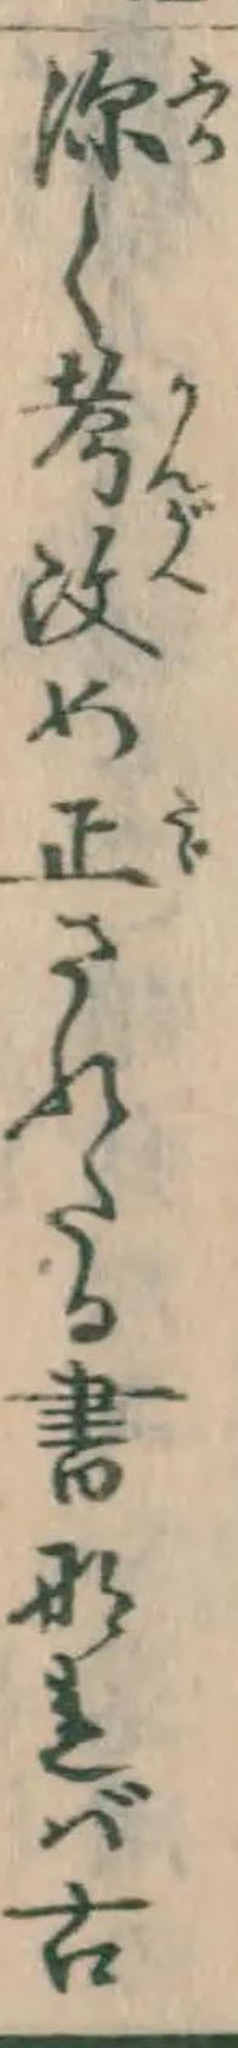深く考改め正されたる書なれば古
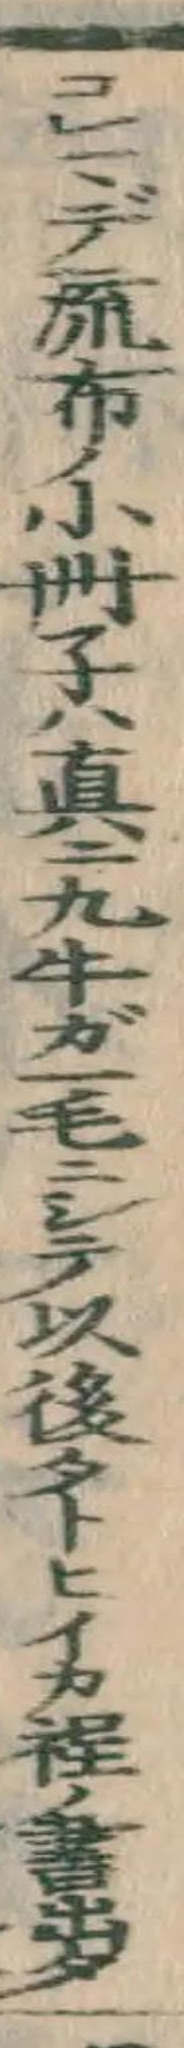コレマデ流布ノ小冊子ハ真ニ九牛ガ一毛ニシテ以後タトヒイカ程ノ書出タ
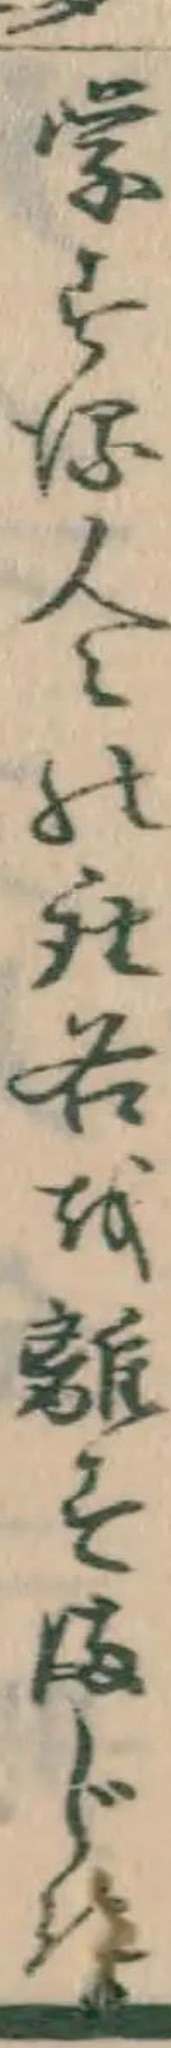学する人々の座右を離すまじき
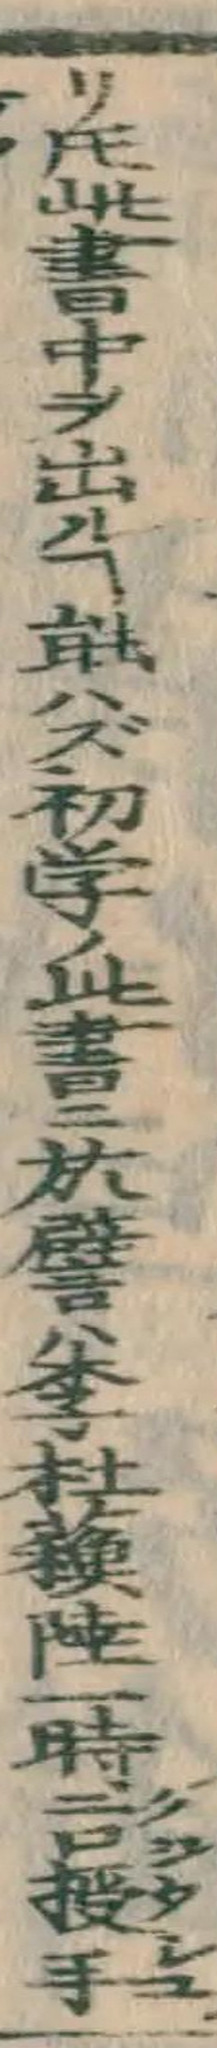リトモ此書中ヲ出ルコト能ハズ初学ノ此書ニ於譬ハ李杜蘇陸一時ニ口授手
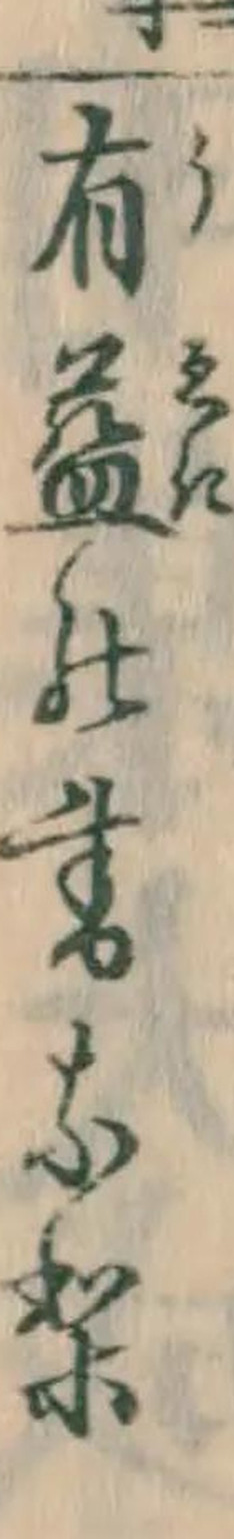有益の書なり
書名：これこれ草 2巻. [2]
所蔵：国立国会図書館 National Diet Library, JAPAN
